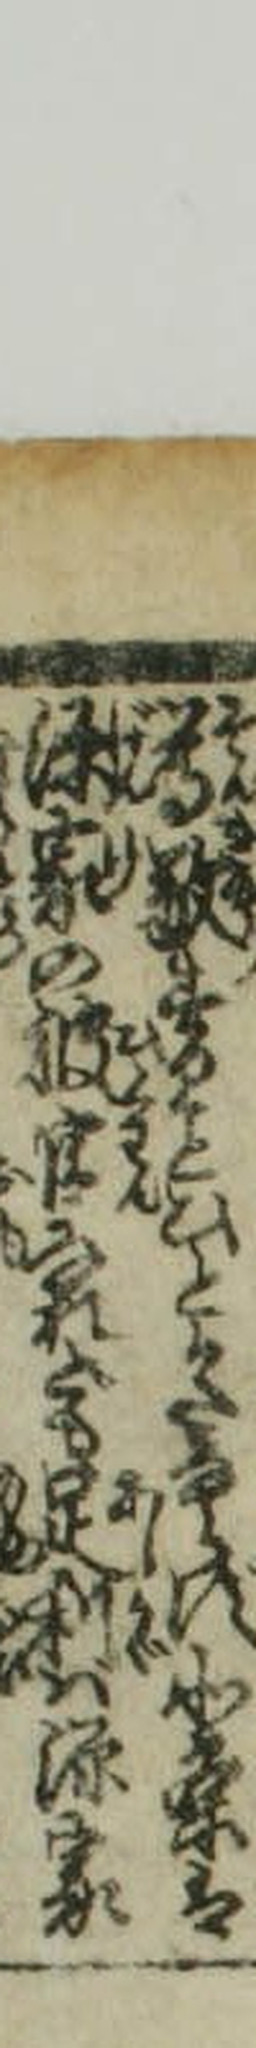源家の被官なれども足利は源家
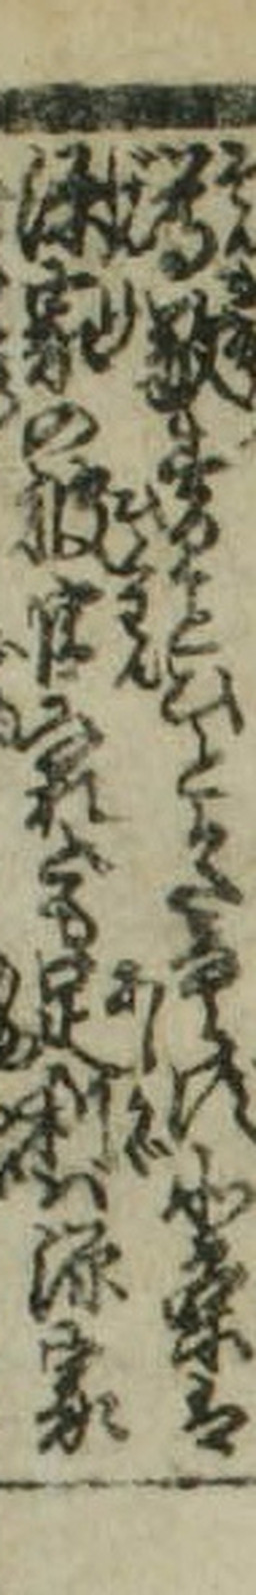源家の被官なれども足利は源家
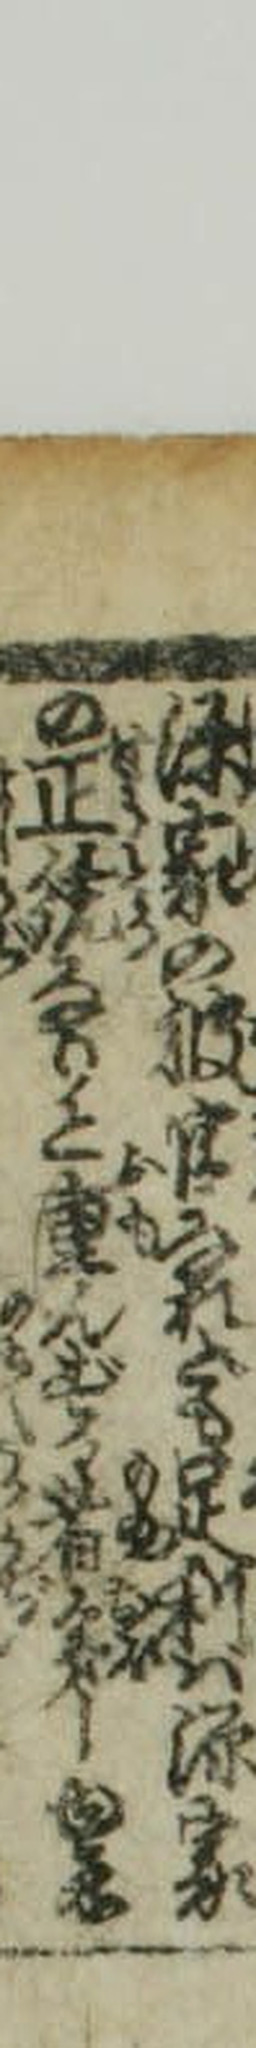の正統なりと重んずる者多しゆゑ
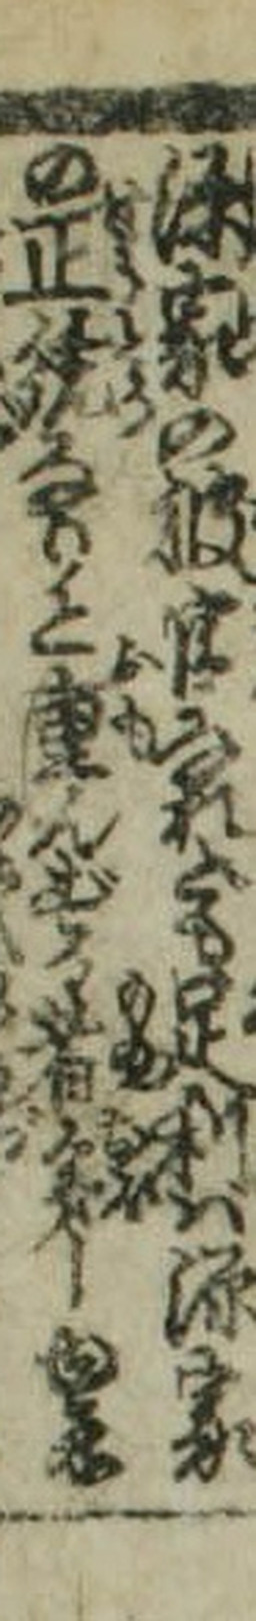の正統なりと重んずる者多しゆゑ
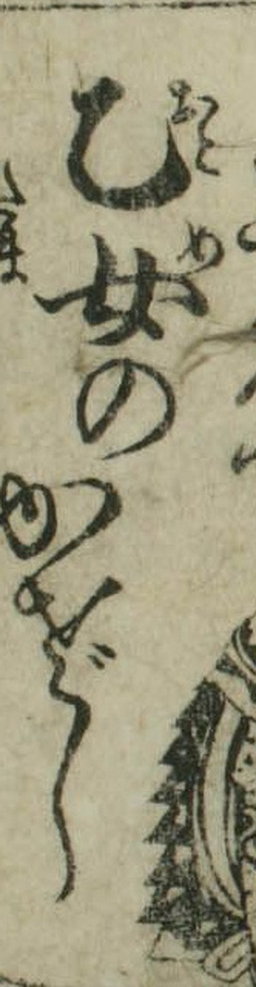乙女のかざし
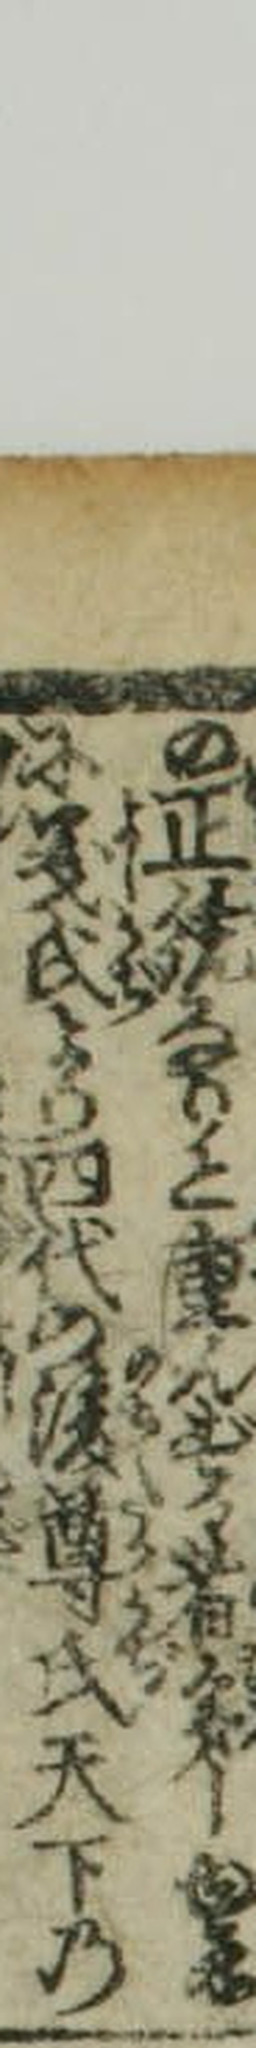に義氏より四代の後尊氏天下の
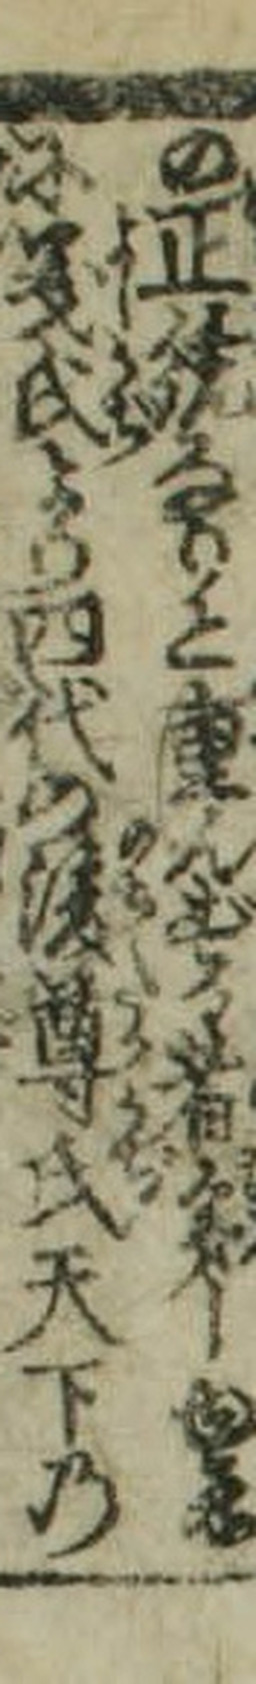に義氏より四代の後尊氏天下の
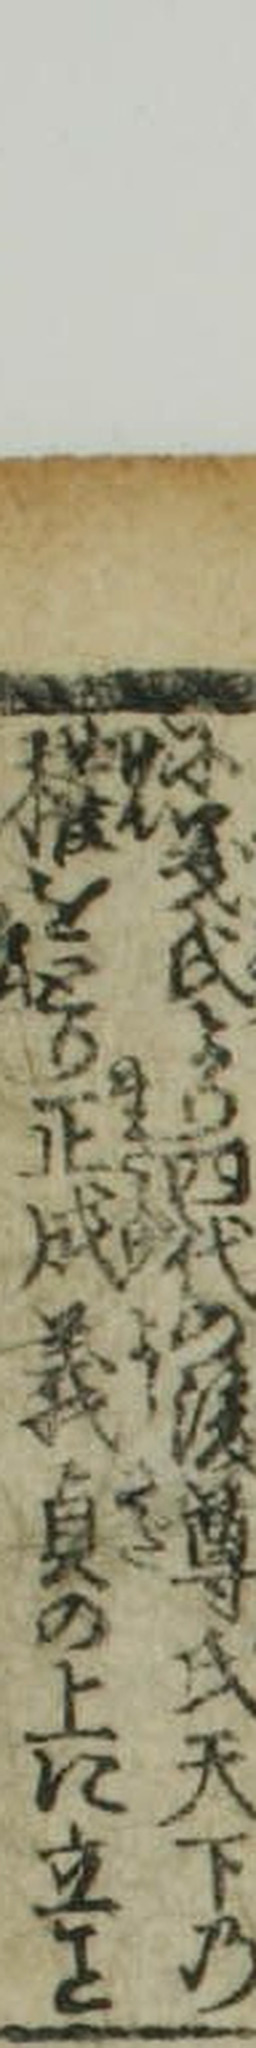権をとり正成義貞の上に立こと
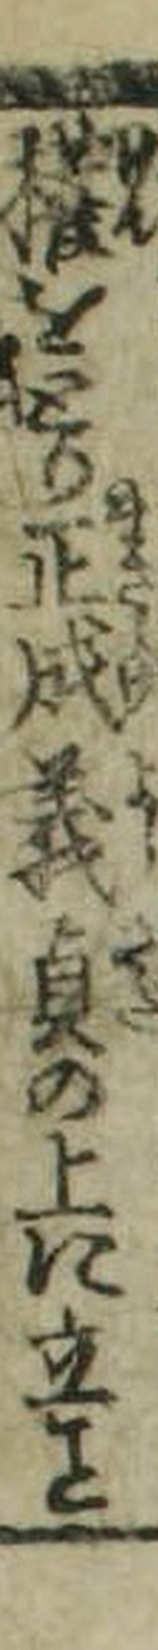権をとり正成義貞の上に立こと
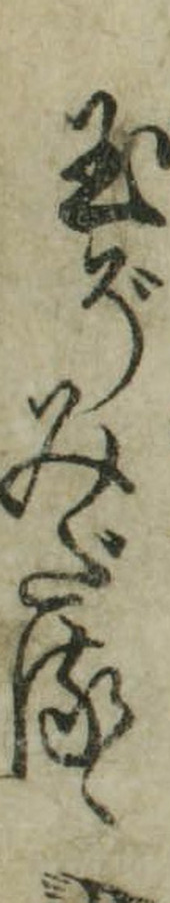玉ぞみだるゝ
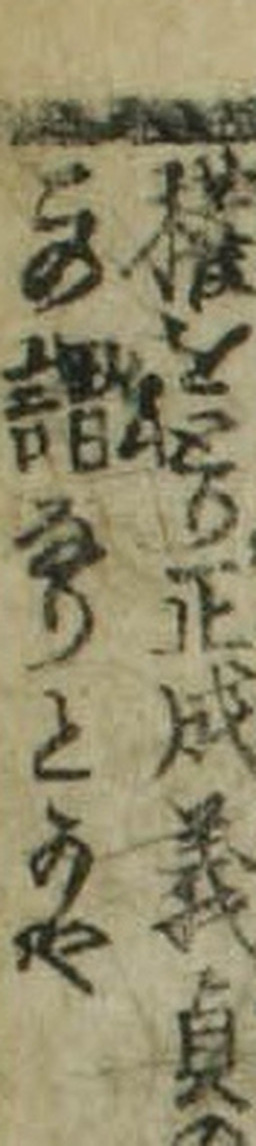この謂なりとかや

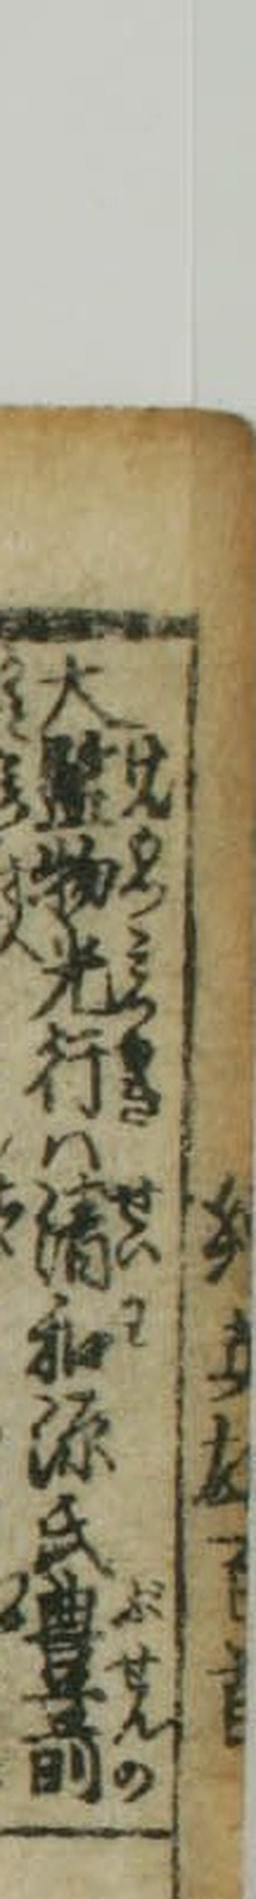大監物光行は清和源氏豊前
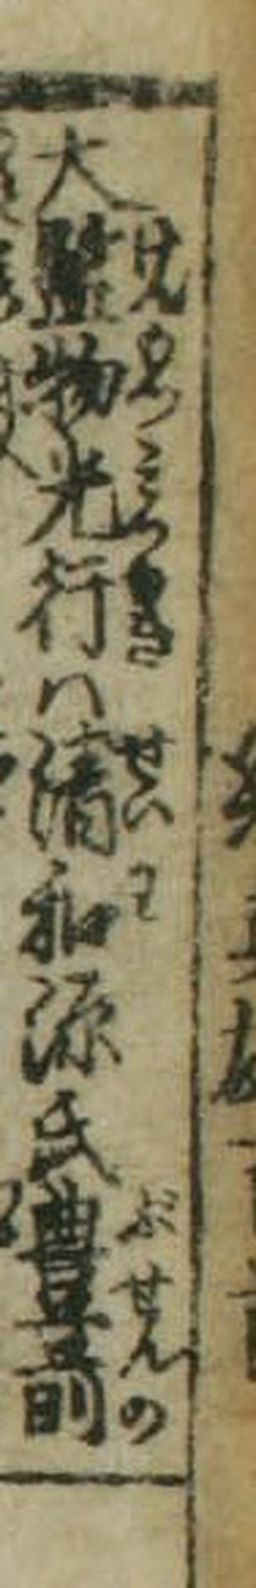大監物光行は清和源氏豊前
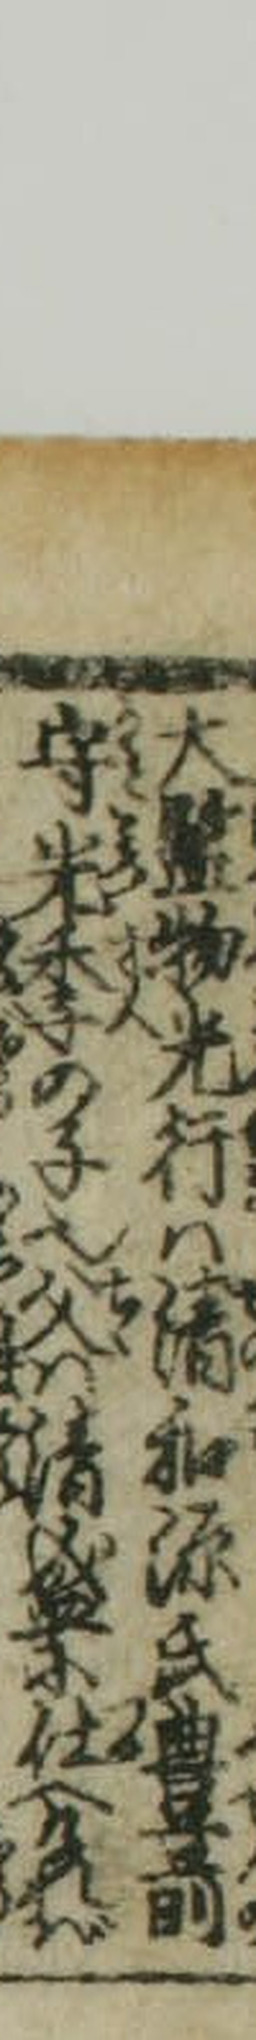守光季の子也父は清盛に仕へければ
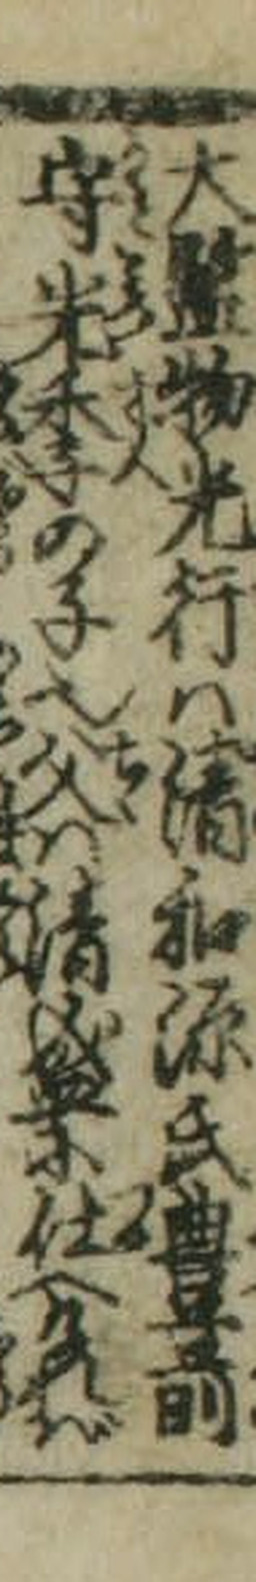守光季の子也父は清盛に仕へければ
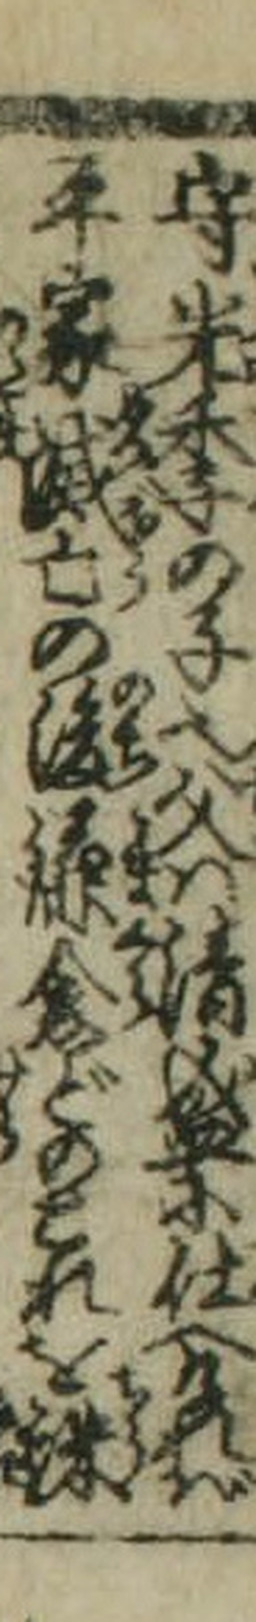平家滅亡の後鎌倉どのこれを誅
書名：續英雄百人一首
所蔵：東京学芸大学附属図書館
